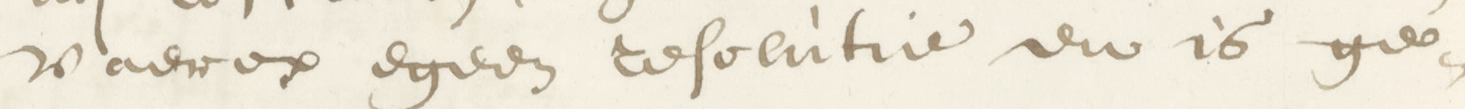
Waerop egeen resolutie en is ge„
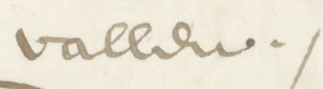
vallen.
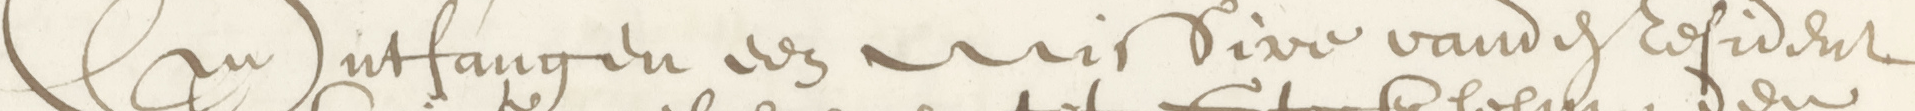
Ontfangen een Missive vanden resident
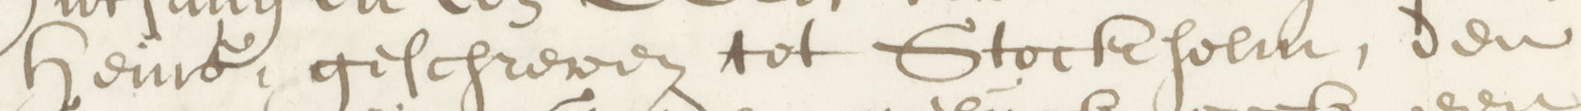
Heins, geschreven tot Stockholm, den
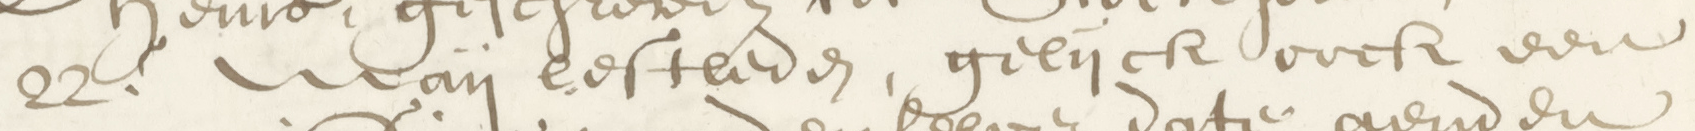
22e. Maij lestleden, gelijck oock een
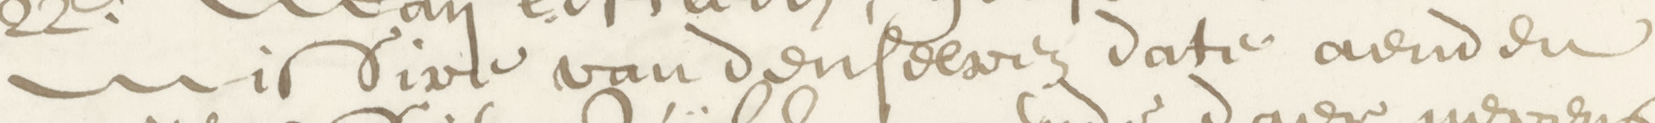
Missive van denselver date aenden
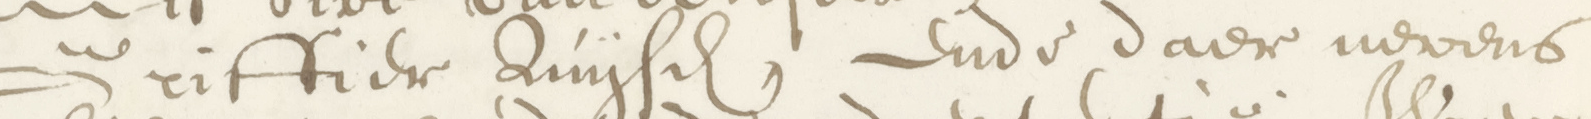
Griffier Ruijsch, ende daer nevens
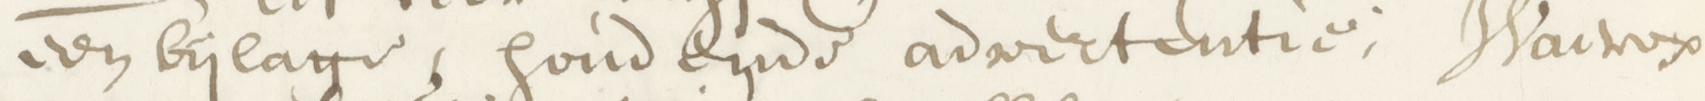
een bijlage, houdende advertentie. Waerop
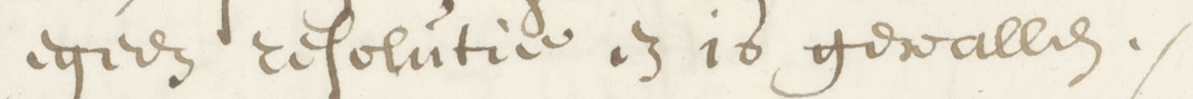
egeen resolutie en is gevallen.
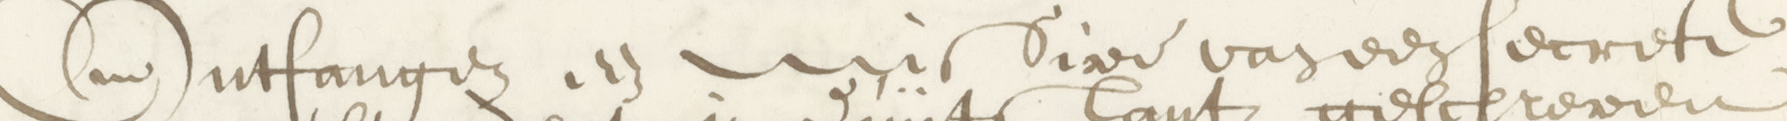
Ontfangen een Missive van een secrete
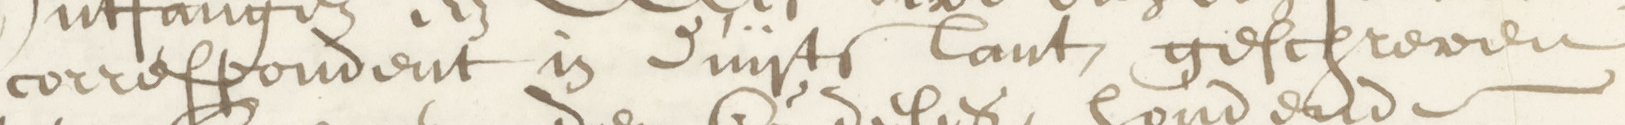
correspondent in duijtslant, geschreven
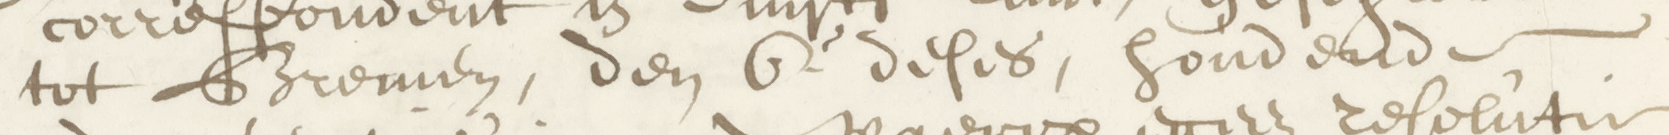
tot Bremen, den 6e. deses, houdende
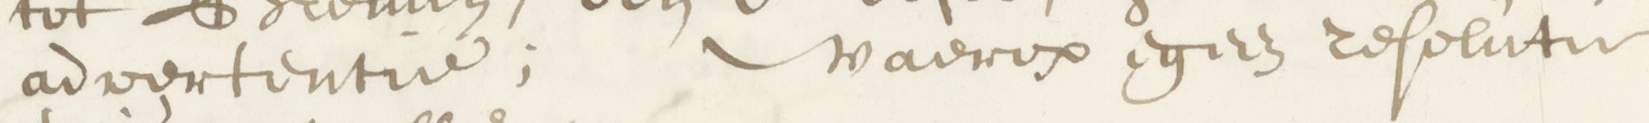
advertentie: Waerop egeen resolutie
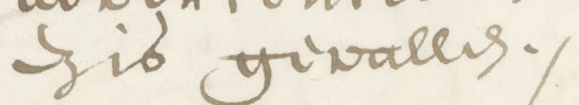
en is gevallen.
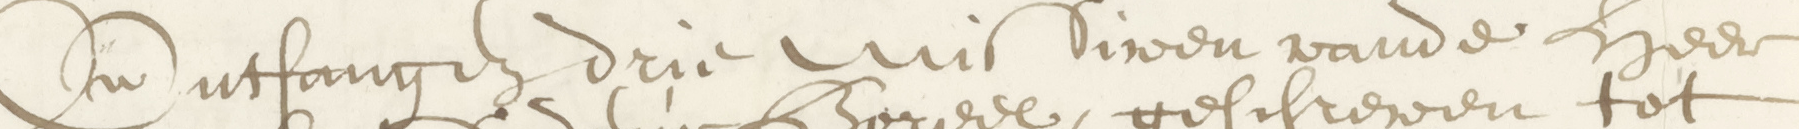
Ontfangen drie Missiven vande Heer
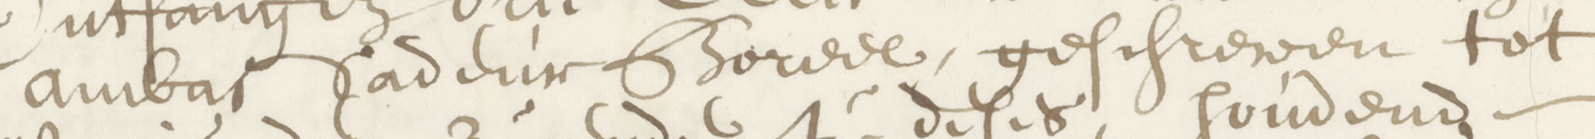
Ambassadeur Boreel, geschreven tot
